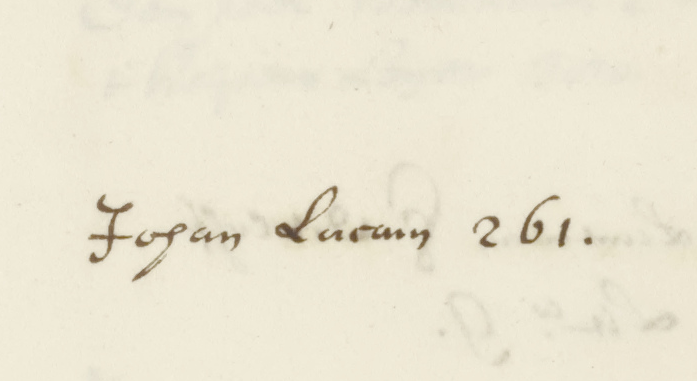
Johan Lacam 261.
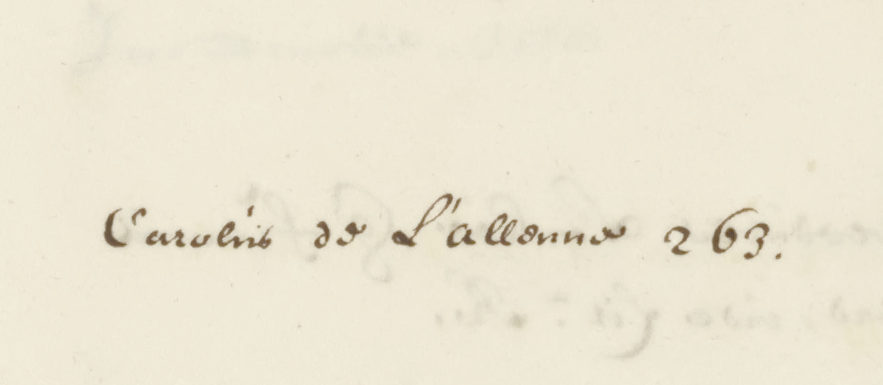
Carolus de L‛Allenne 263.
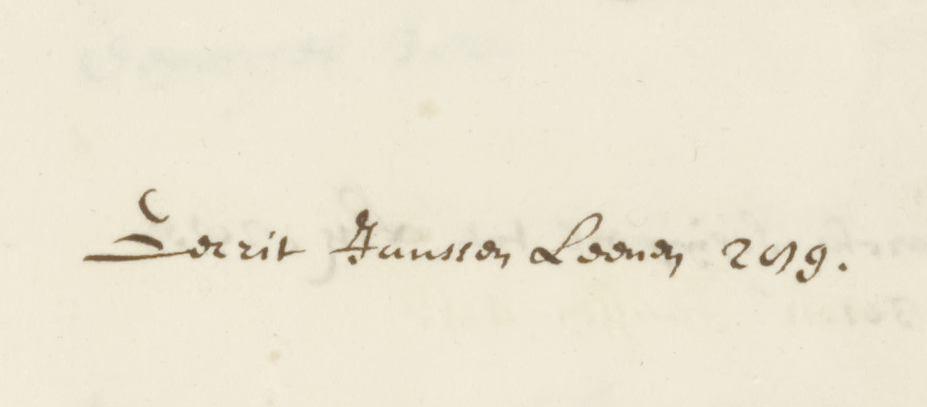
Gerrit Janssen Leenen 289.
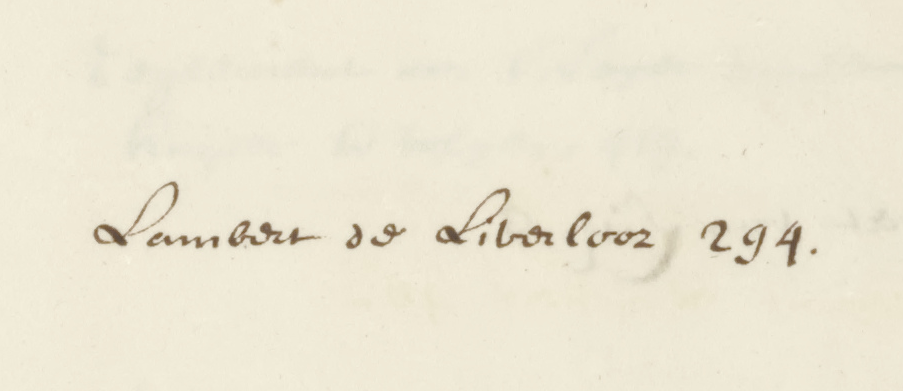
Lambert de Liverlooz 294.
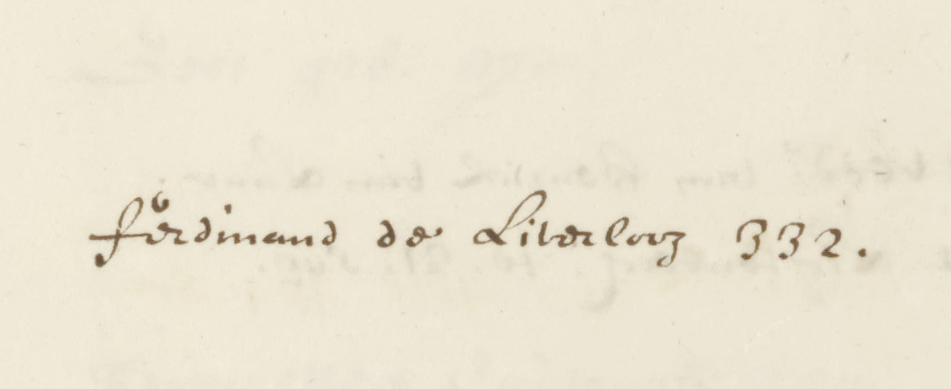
Ferdinand de Liverlooz 332.
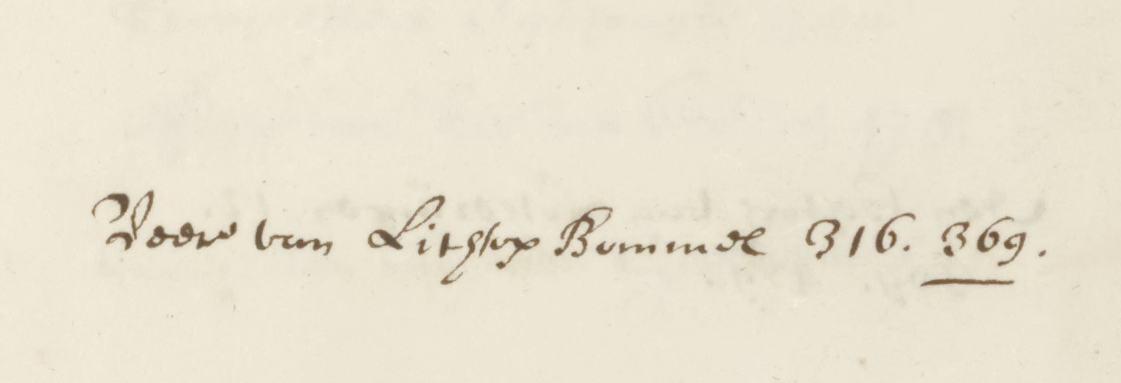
Veer van Lith/op Bommel 316. 369.
